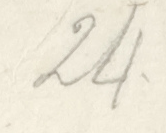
24
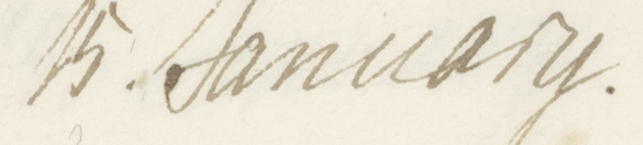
15. January.
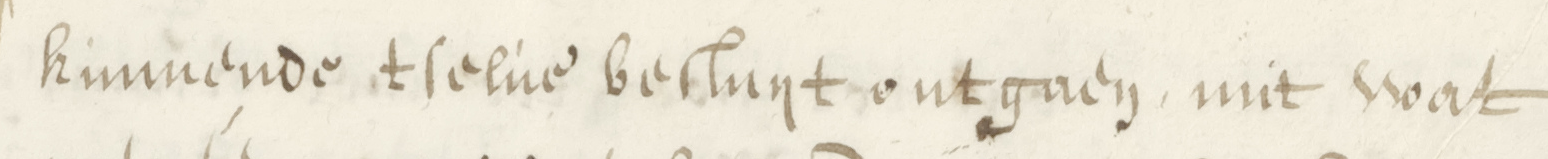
kunnende tselue besluyt ontgaen, mit wat
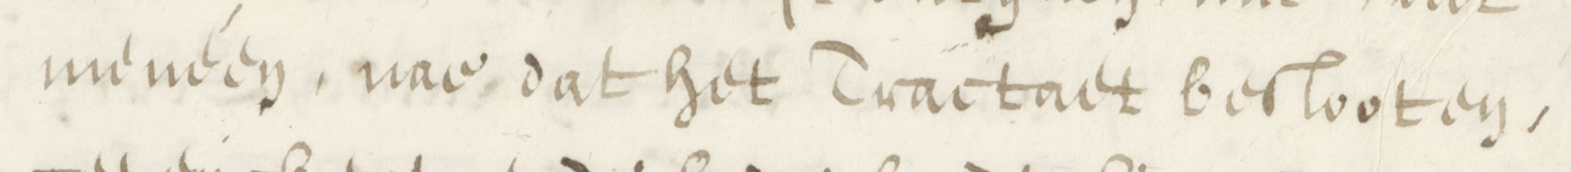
menéen, nae dat het Tractaet beslooten,
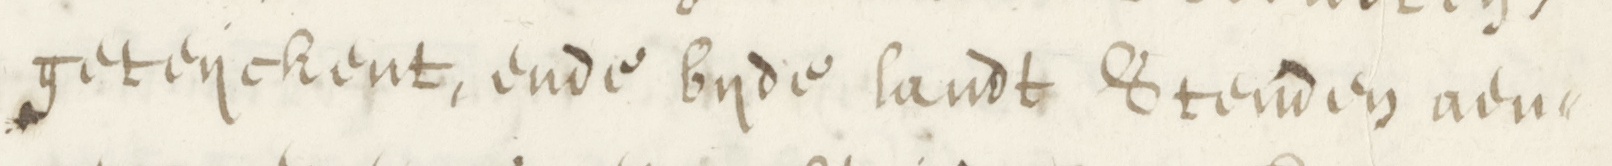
geteyckent, ende byde landt Stenden aen„
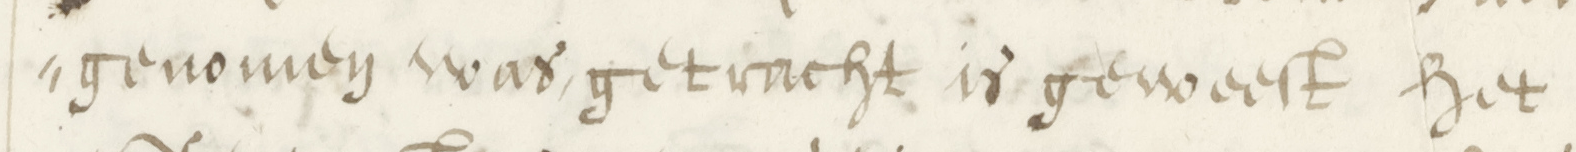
,,genomen was, getracht is geweest het
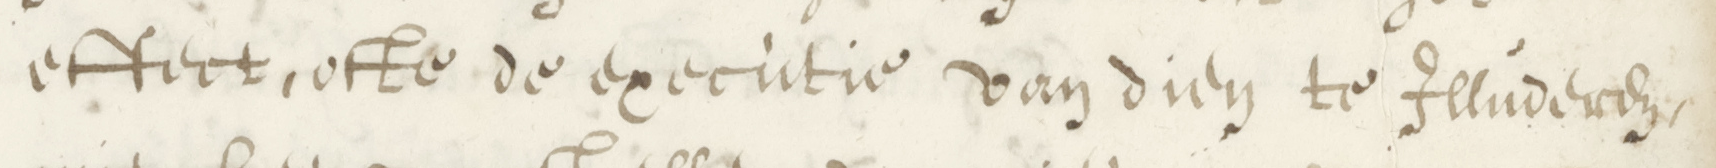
effect, ofte de executie van dien te Illuderen
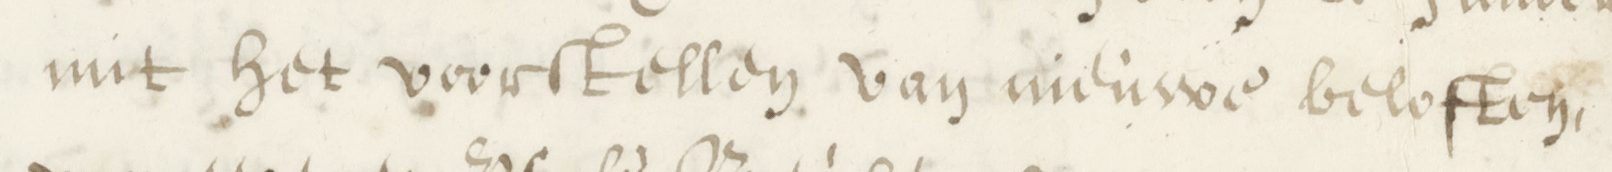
mit het voorstellen van nieuwe beloften,
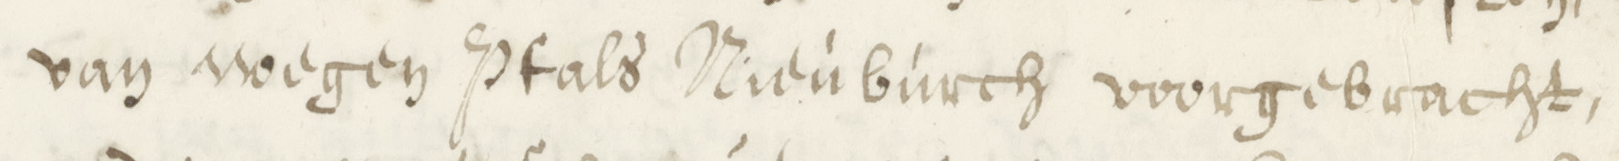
van wegen Pfals Nieuburch voorgebracht,
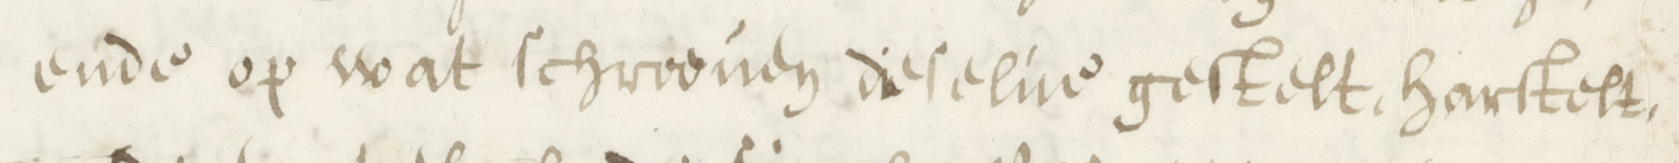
ende op wat schroeuen deselue gestelt, harstelt,
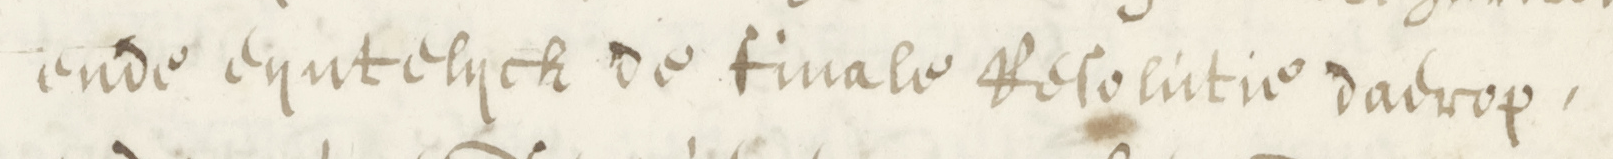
ende eyntelyck de finale Resolutie daerop,
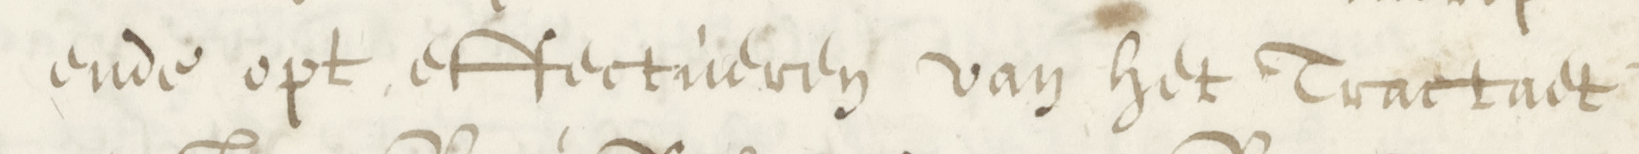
ende opt effectueren van het Tractaet
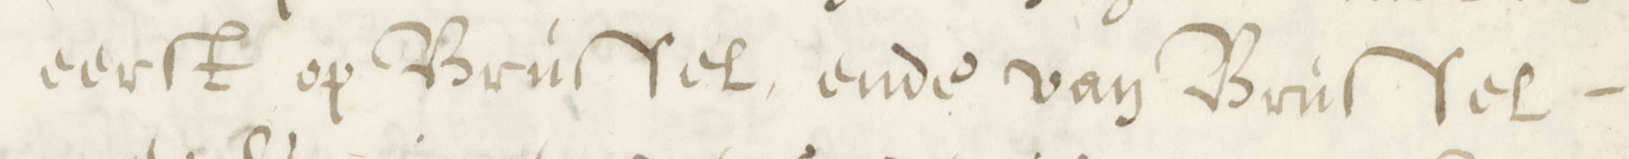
eerst op Brussel, ende van Brussel -
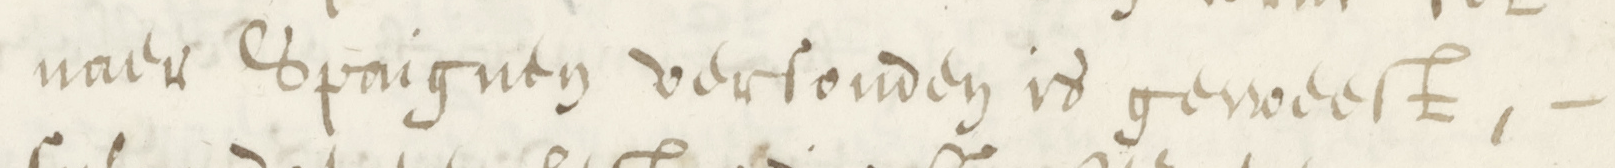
naer Spaignen versonden is geweest, -
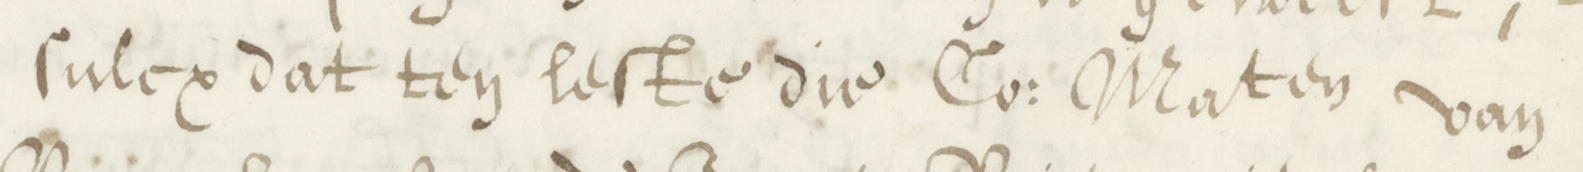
sulcx dat ten leste die Co: Maten van
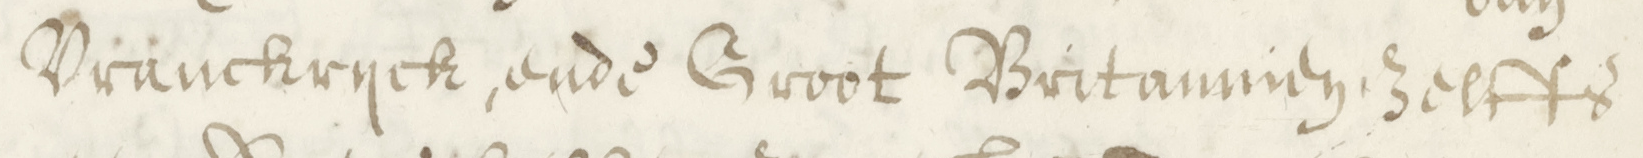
Vranckryck, ende Groot Brittannien, zelffs
